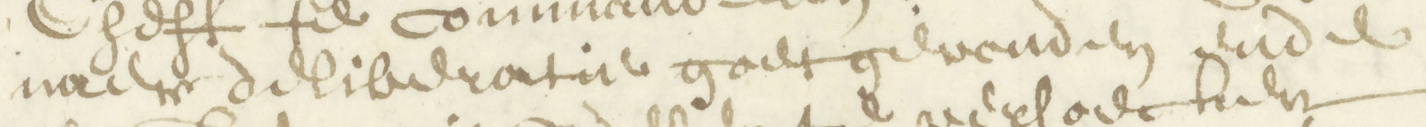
naer deliberatie goetgevonden ende
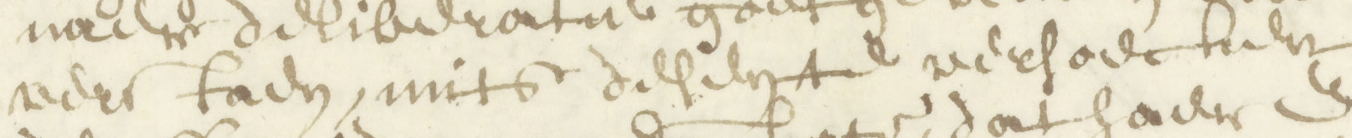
verstaen, mits desen te versoecken
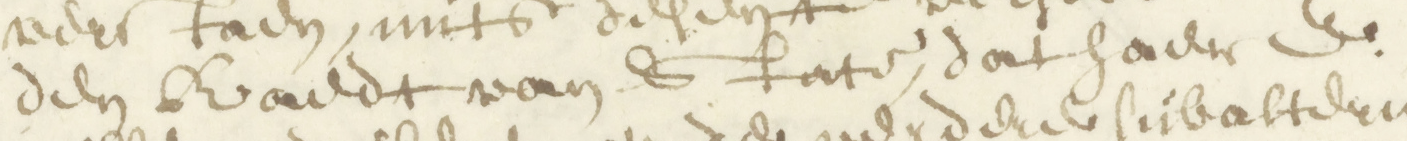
den Raedt van State, dat haer E.
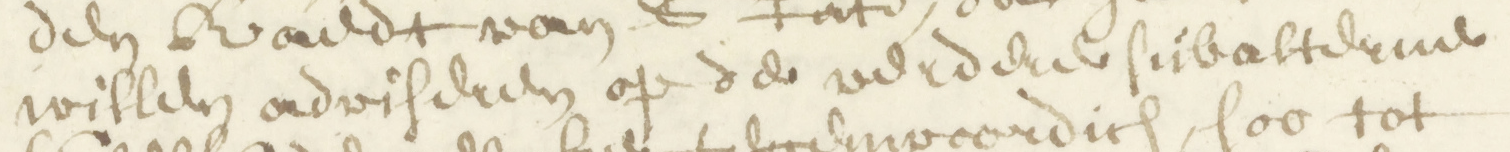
willen adviseren op de verdere subalterne
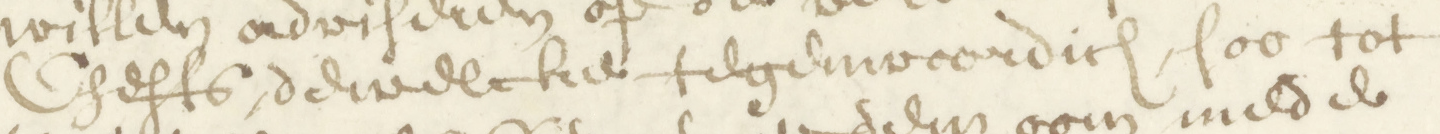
Cheffs, derwelcke tegenwoordich, soo tot
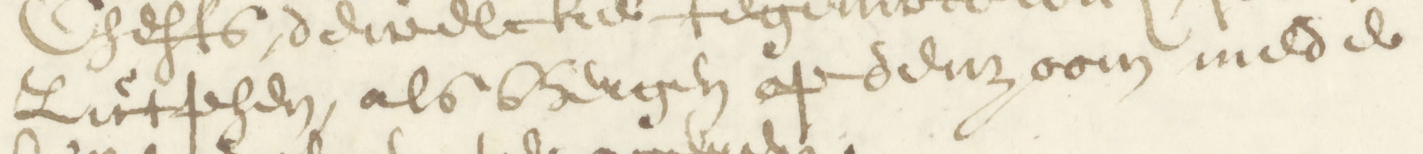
Zutphen, als Bergen op den zoom mede
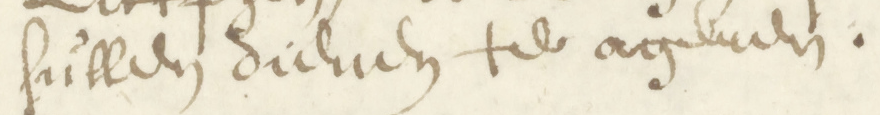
sullen dienen te ageren.
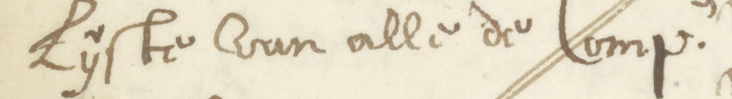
Lijste van alle de Compen.
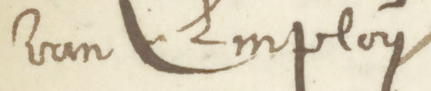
van Emploij
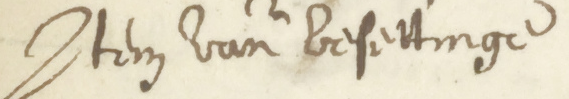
Item van besettinge
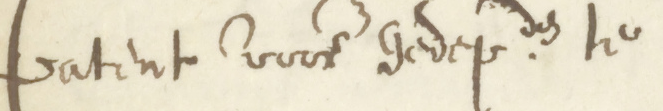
Patent voor gedepden. te
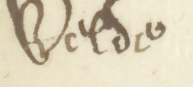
Velde
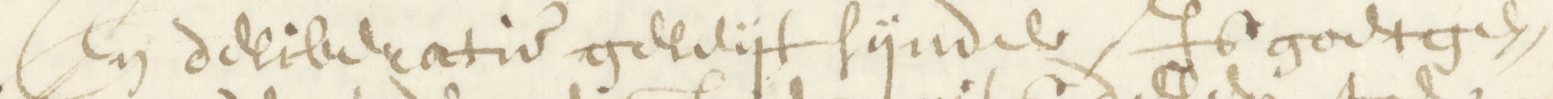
In deliberatie geleijt sijnde, Is goetge,
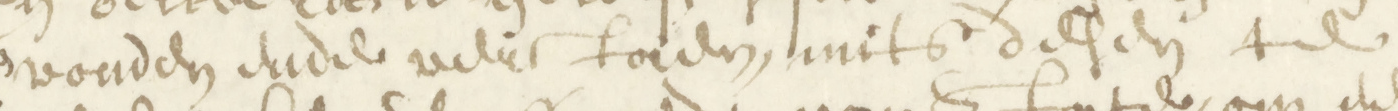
vonden ende verstaen, mits desen te
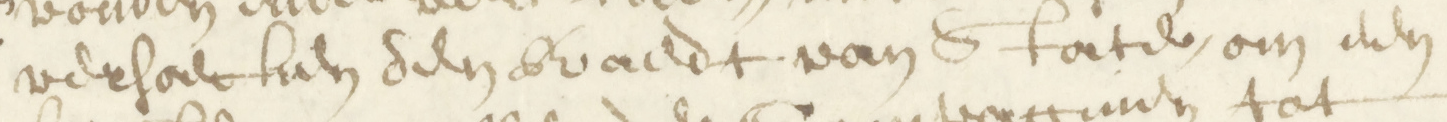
versoecken den Raedt van State, om een
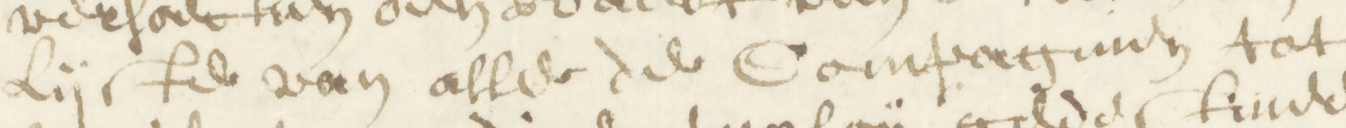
Lijste van alle de Compagnien tot
